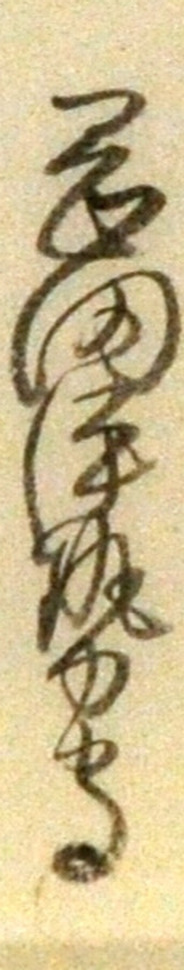岡田伊勢守

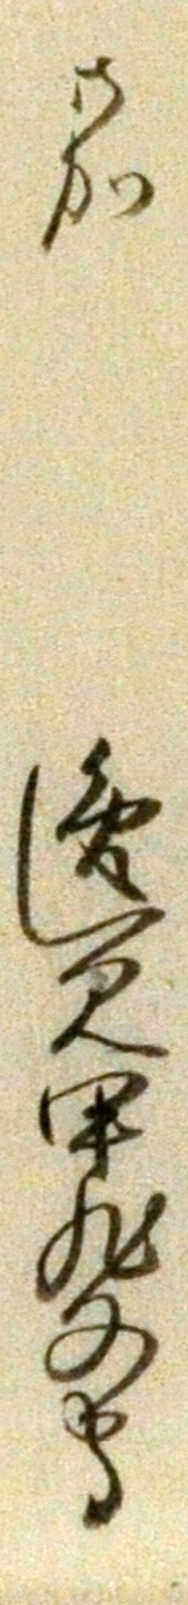御加逸見甲斐守
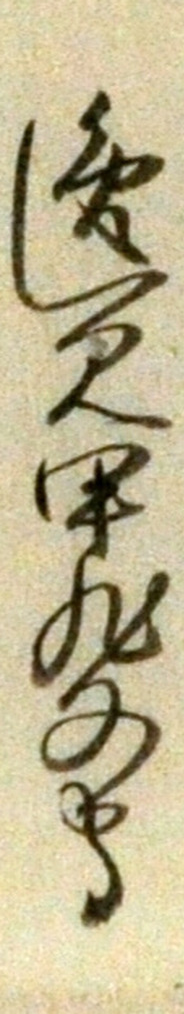御加逸見甲斐守
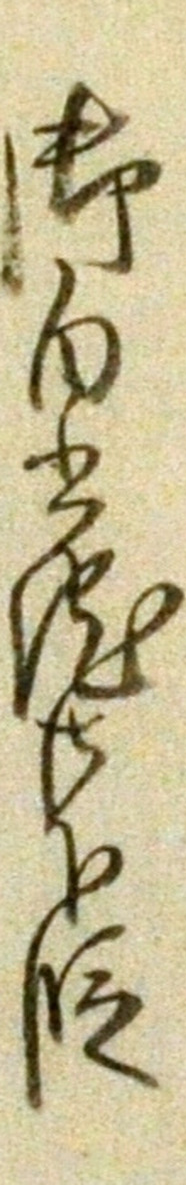御白書院御下段
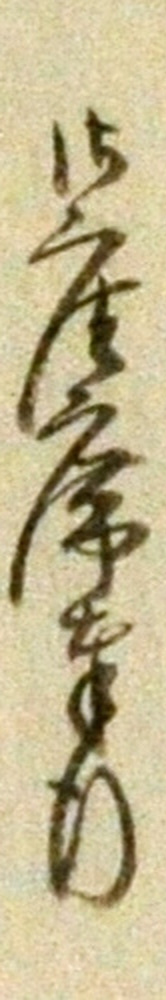御座席奉行
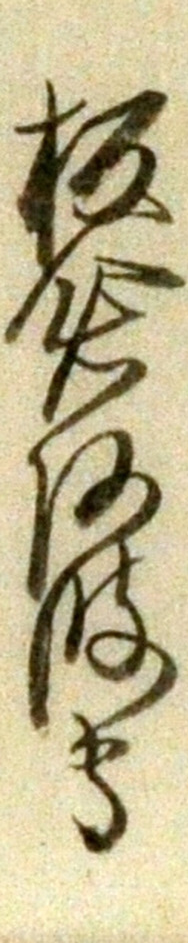板倉阿波守
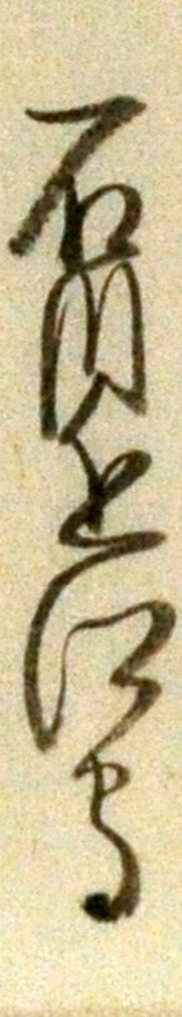石川近江守
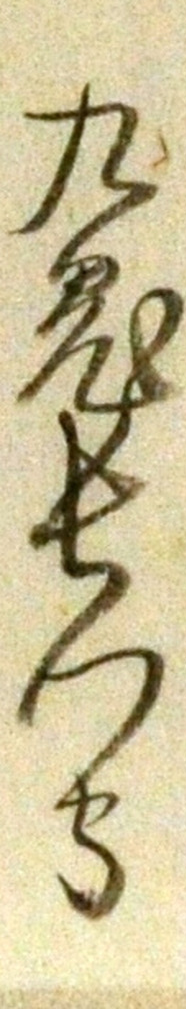九鬼長門守
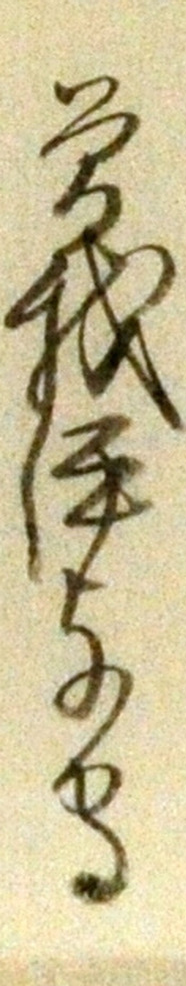曽我伊与守
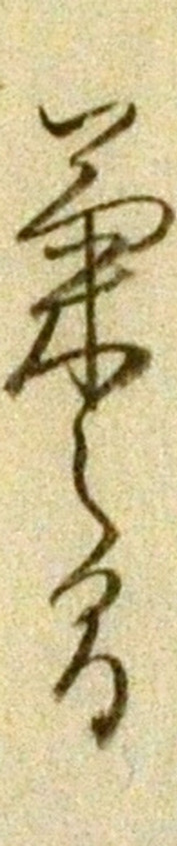菊之間
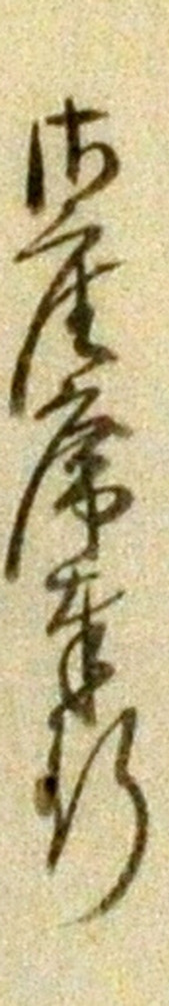御座席奉行
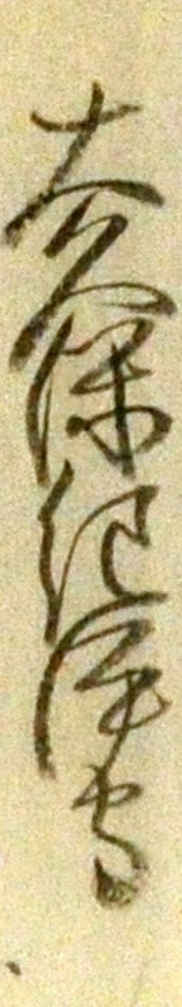大久保紀伊守
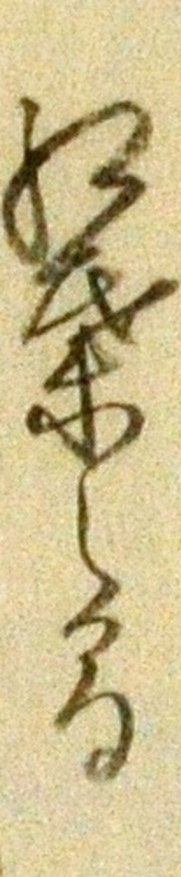紅葉之間
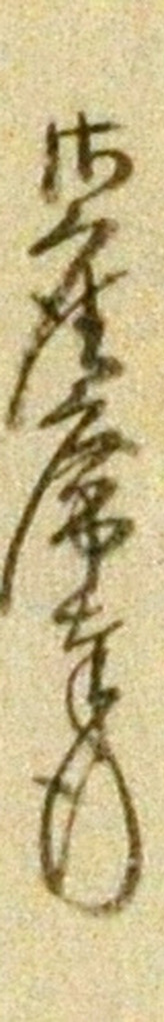御座席奉行
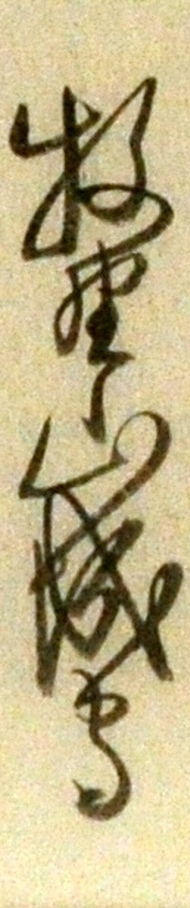牧野山城守
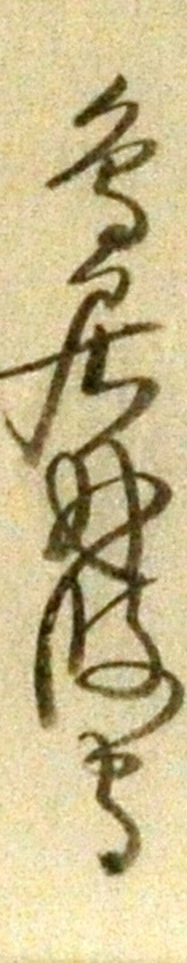鳥居丹波守
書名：御馳走御能ノ節ノ留外
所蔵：伊那市立高遠町図書館・合同会社AMANE
